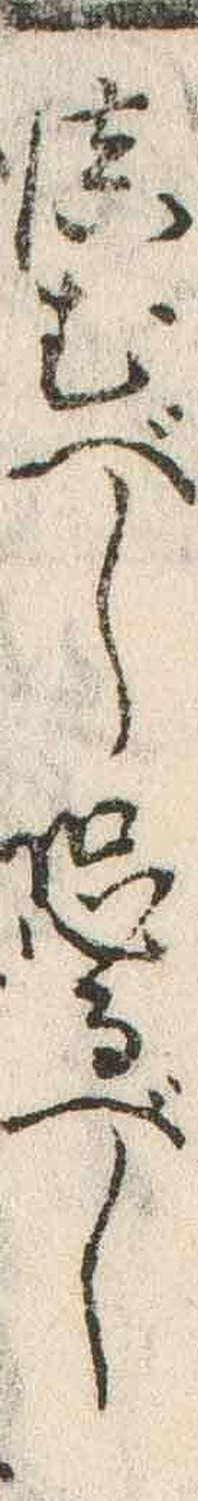慎むべし恐るべし
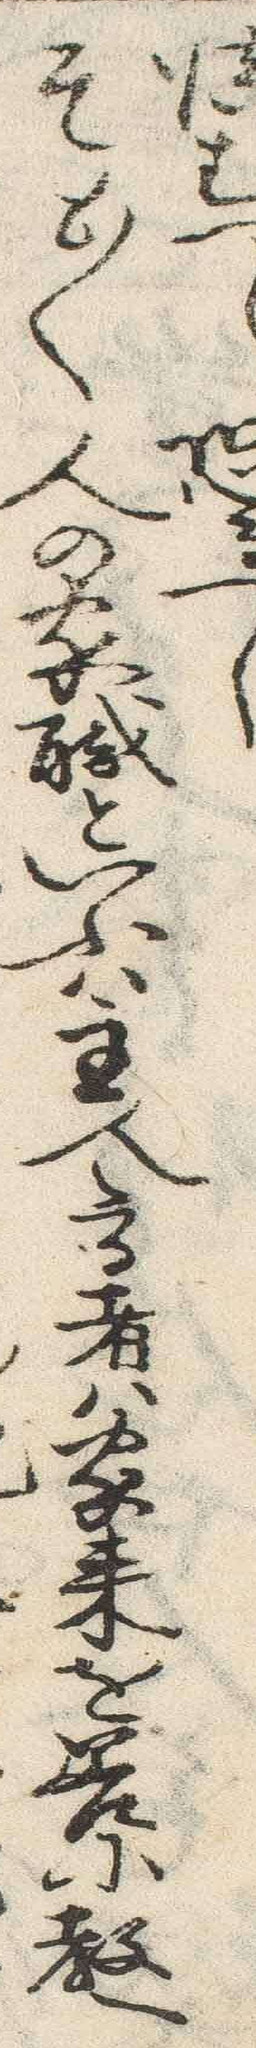そも〳〵人の家職といふは主人たる者は家来を善に教へ
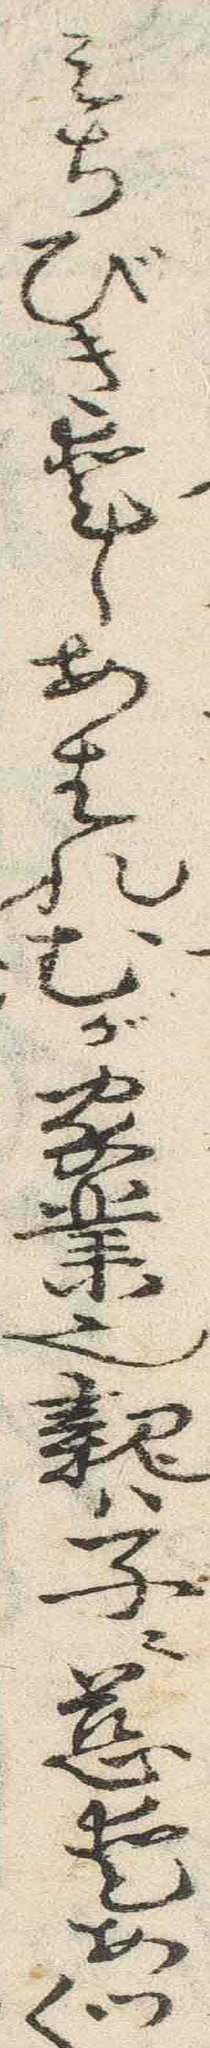みちびき愛しあはれむが家業也親は子に慈愛あつく
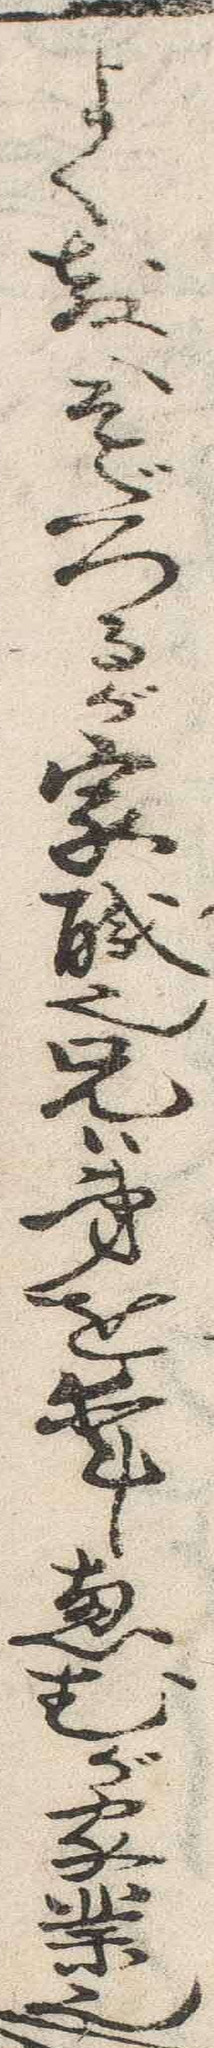よく教へそだつるが家職也兄は弟を愛し恵が家業也
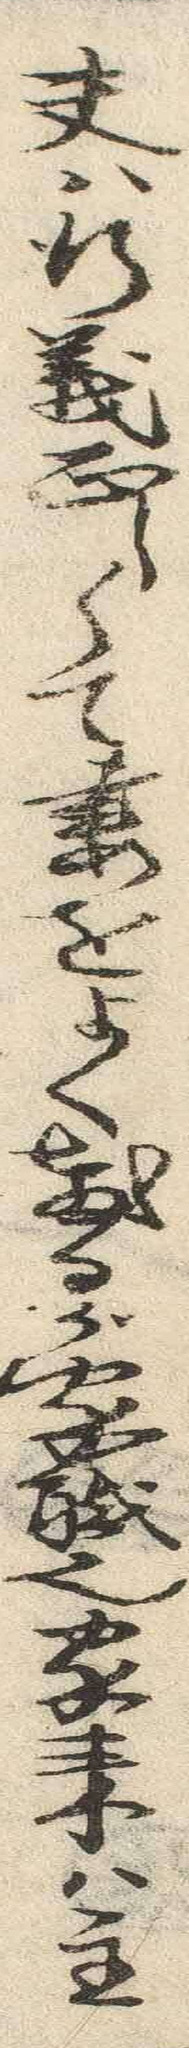夫は行儀正しくて妻をよく教るが家職也家来は主
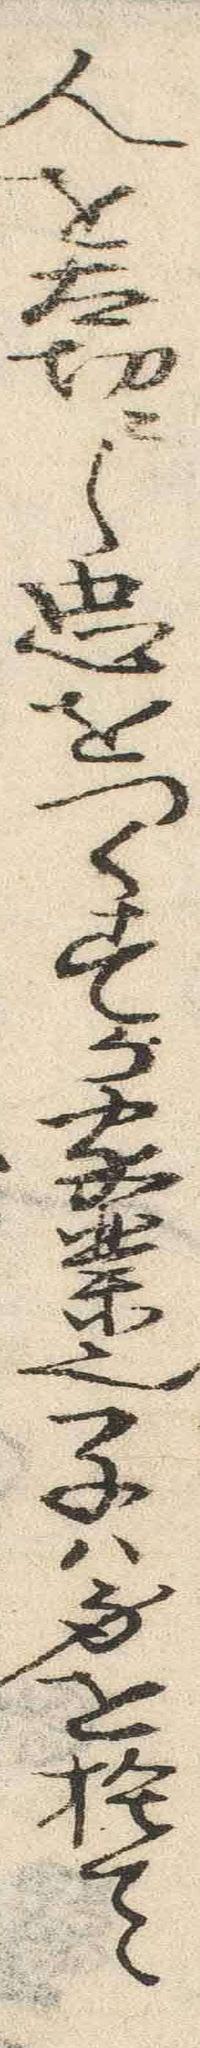人を太切にし忠をつくすが家業也子は身を捨てゝ
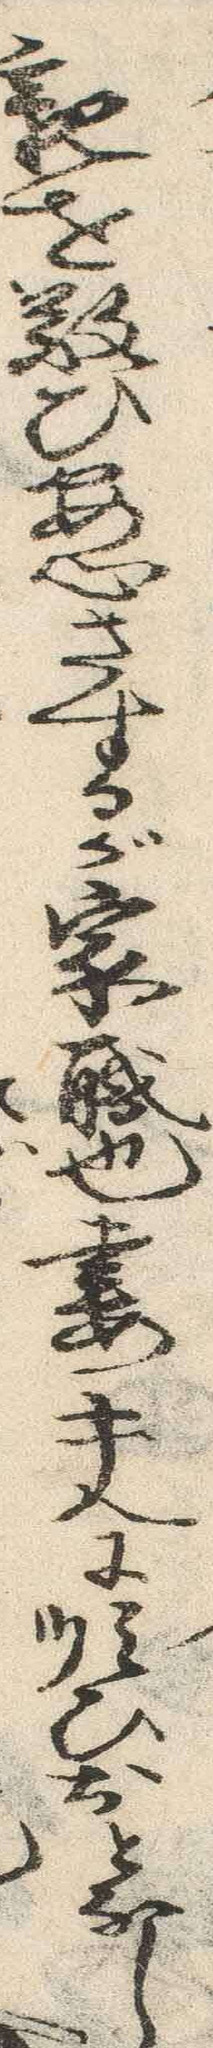親を敬い安心さするが家職也妻夫に順ひおとなしく
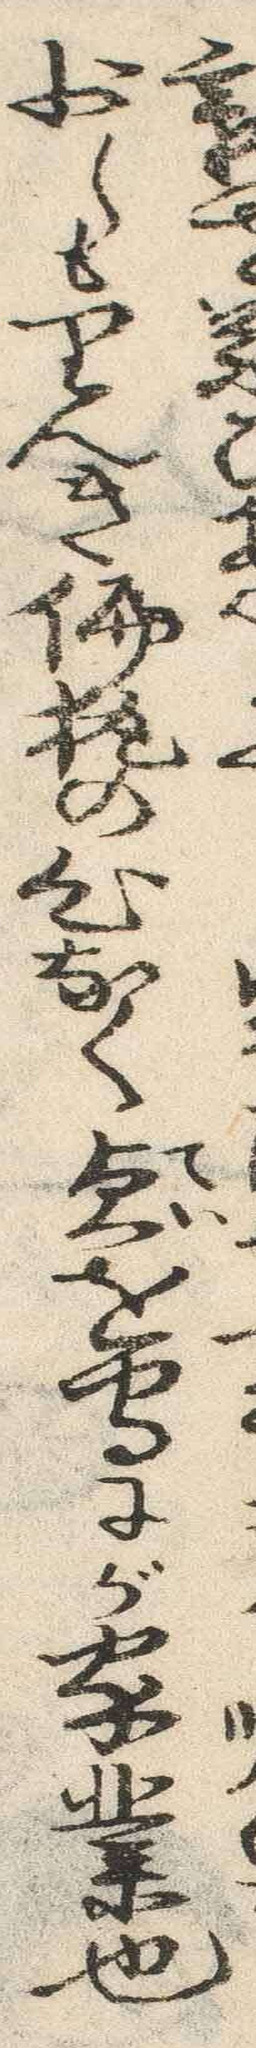少しもりんき偏執の心なく貞を守にが家業也
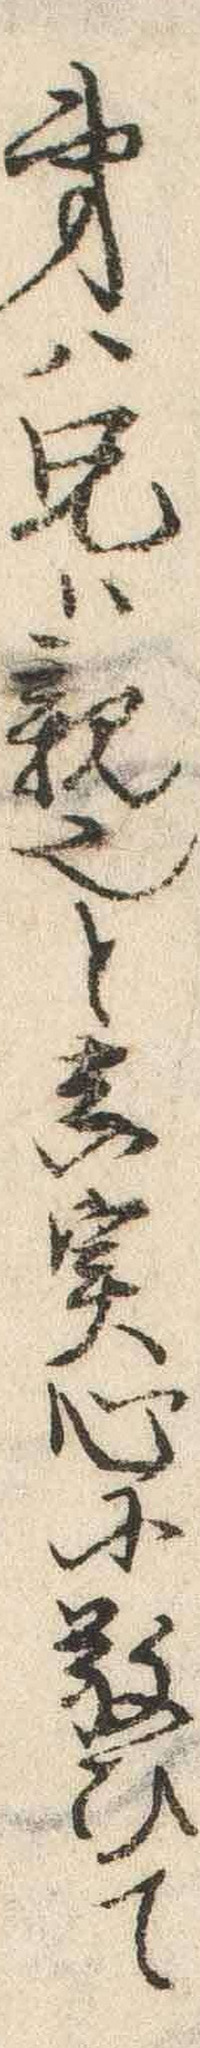弟は兄は親也と真実心に敬ひて
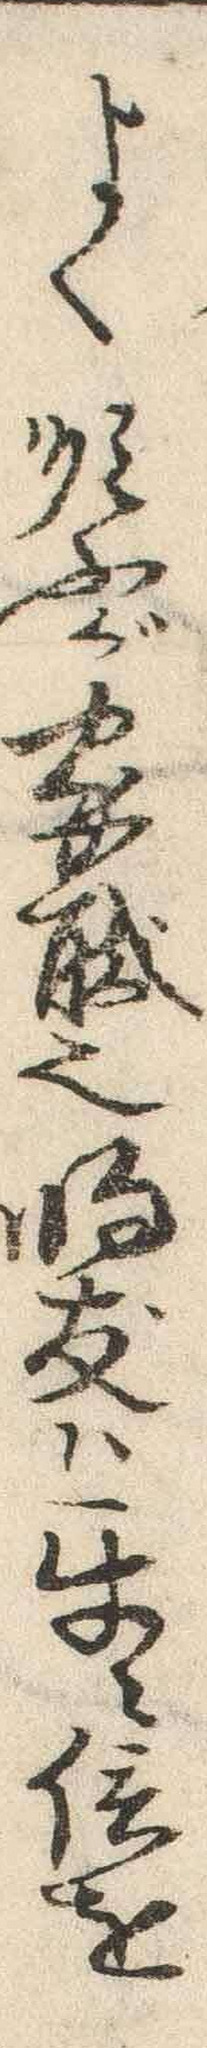よく順ふが家職也朋友は互に信を
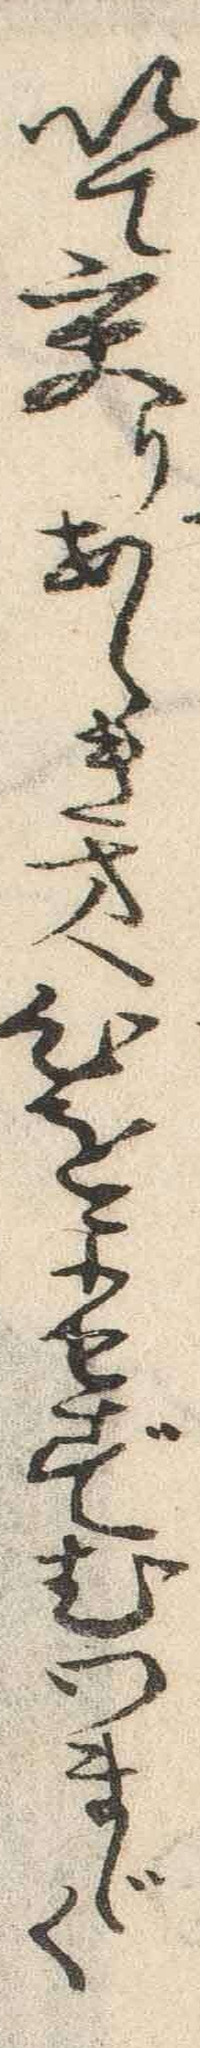以て交りあしき方へ心をよせずむつまじく
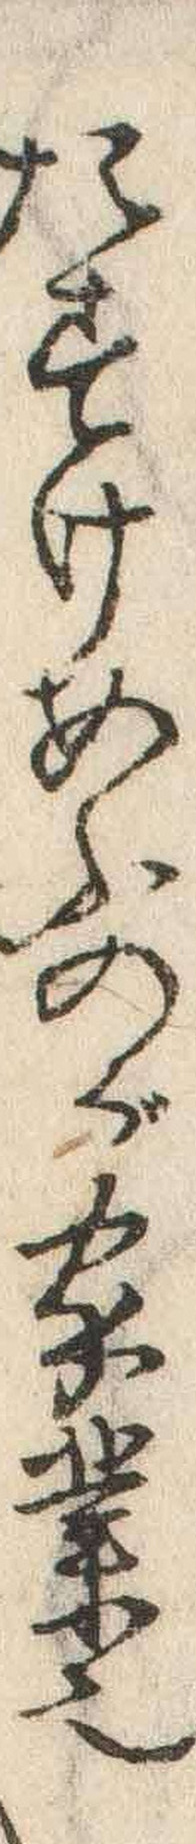たすけあふのが家業也
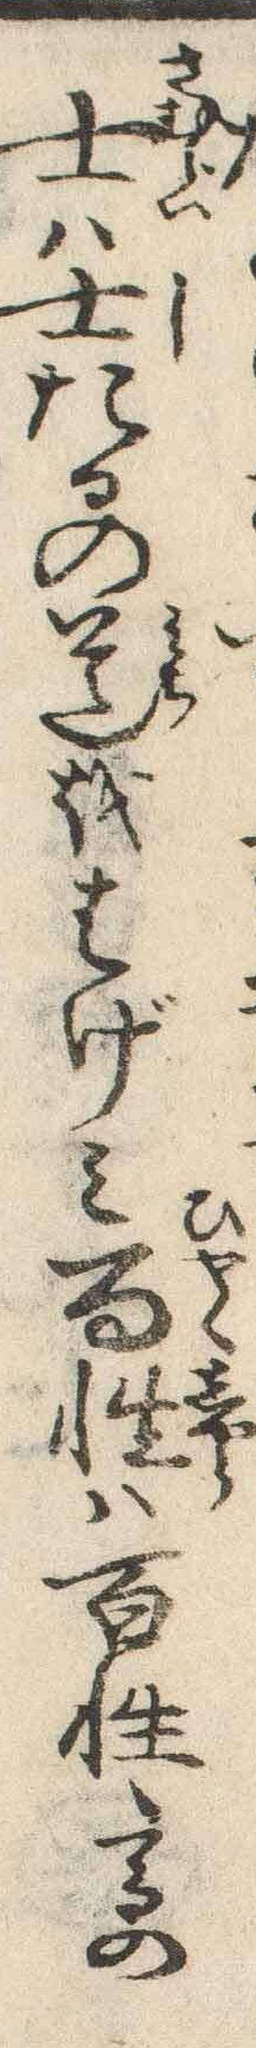士は士たるの道をはげみ百性は百性たるの
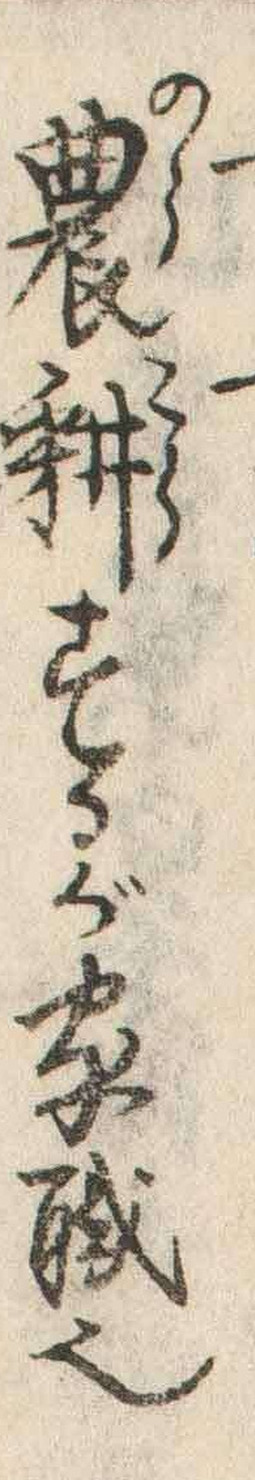農耕するが家職也
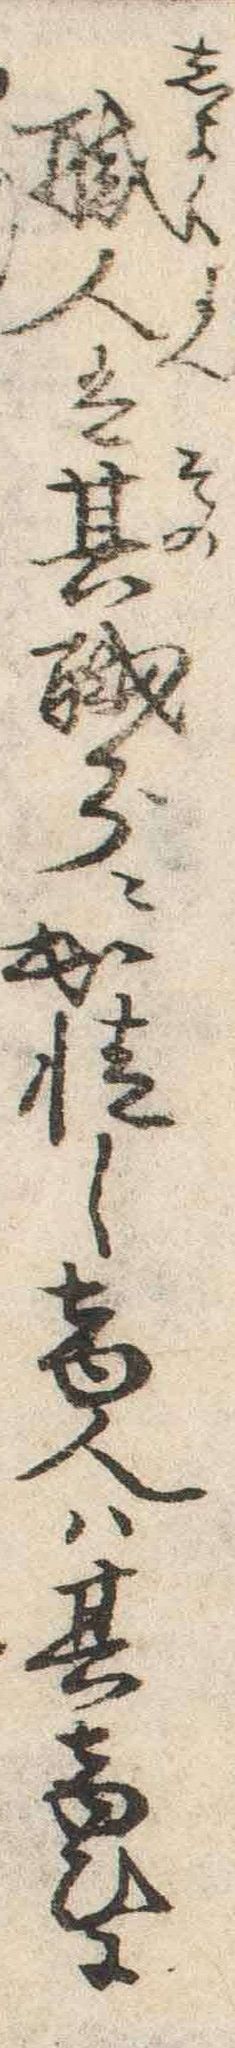職人は其職分に出精し商人は其商ひに
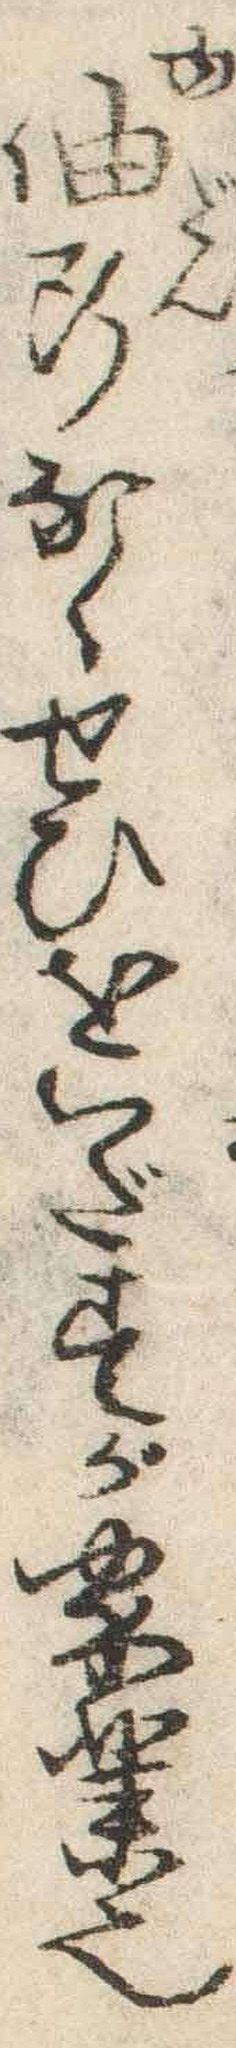油断なくせひをいだすが家業也
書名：撫育草
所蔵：東京学芸大学附属図書館 国文学研究資料館
